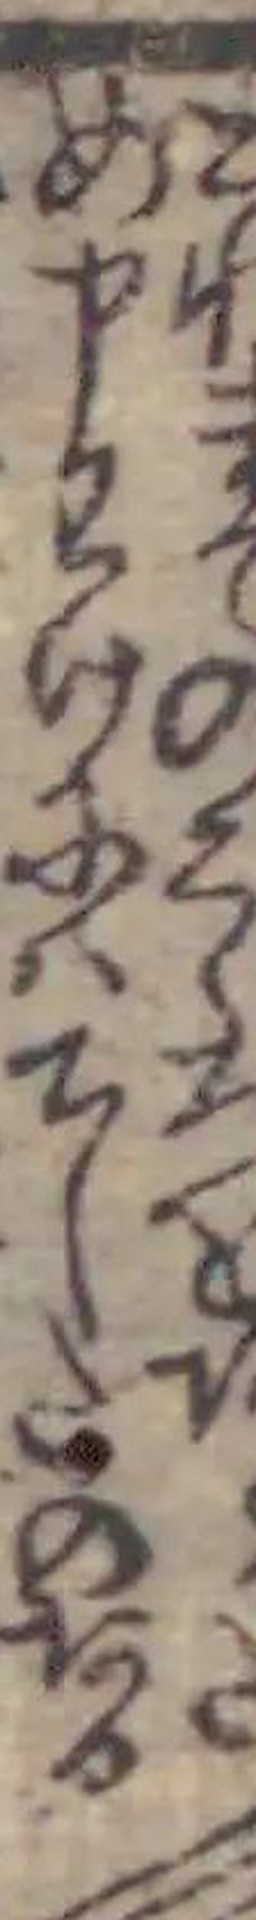め申わけにはてしたのある
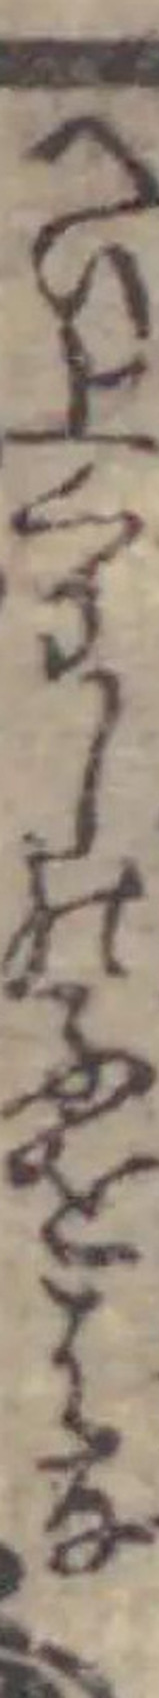へい上くわしのふをはな
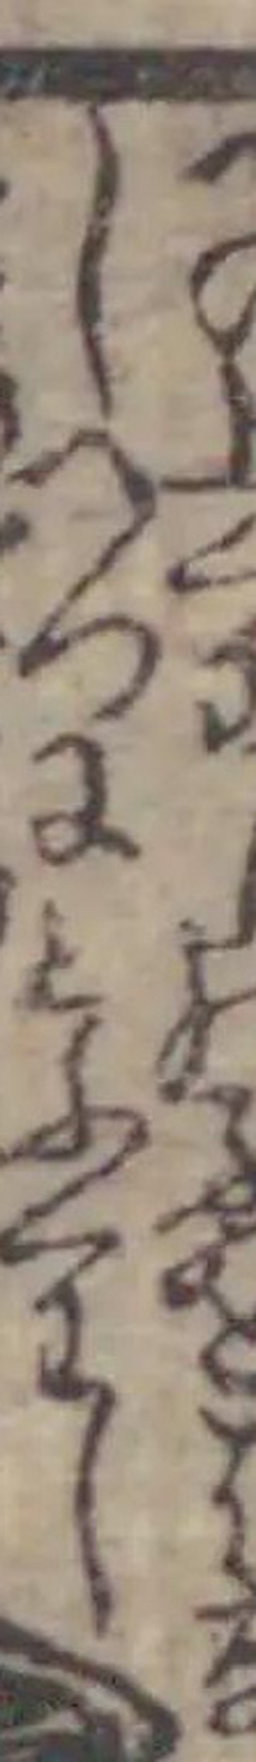しへつにとふくわし
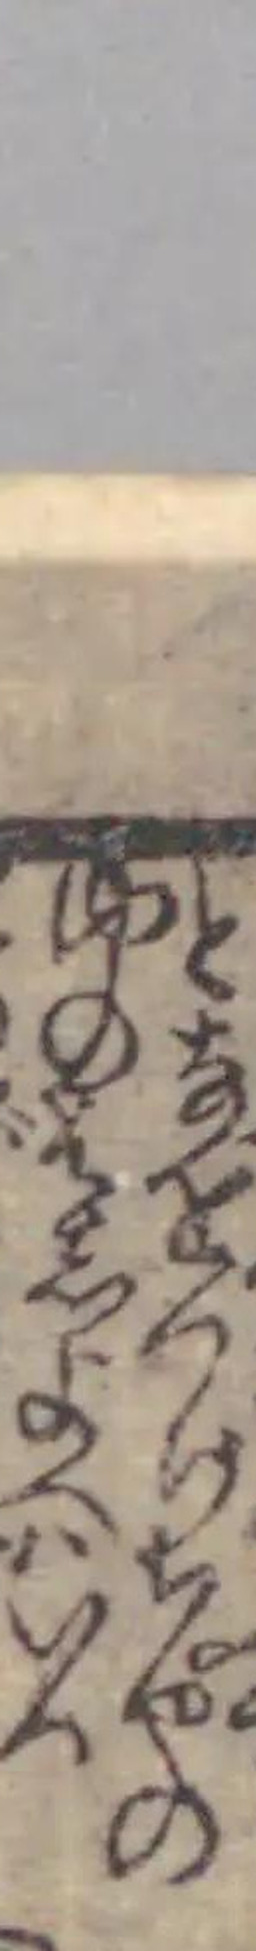ゆのはしよへはいつ
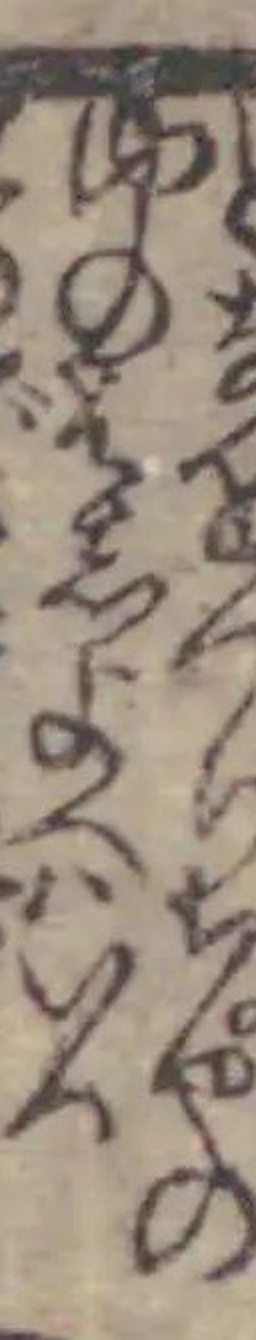ゆのはしよへはいつ
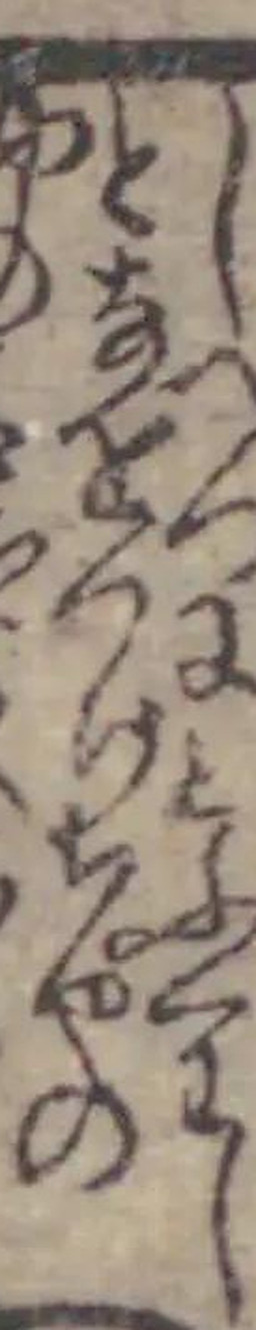となをつけちやの
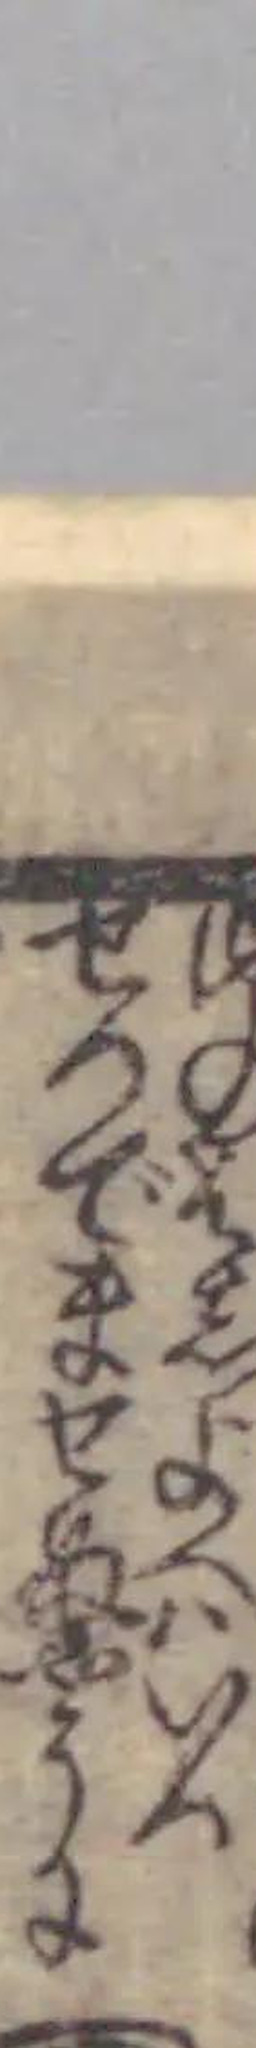せつでませめやうに
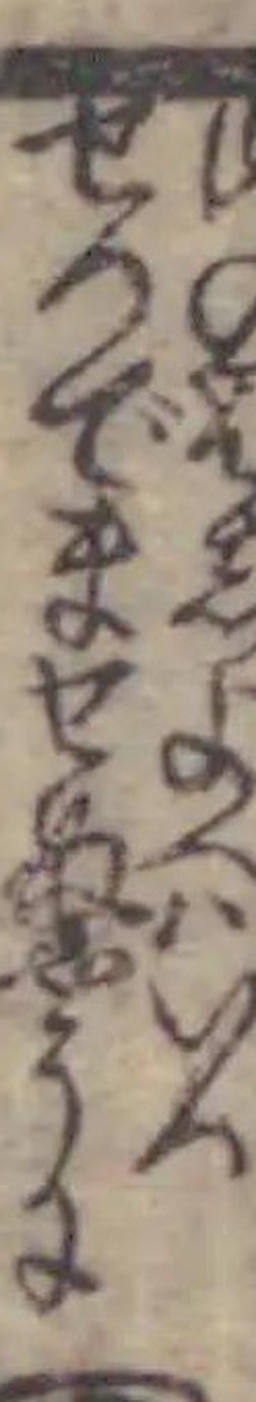せつでませめやうに
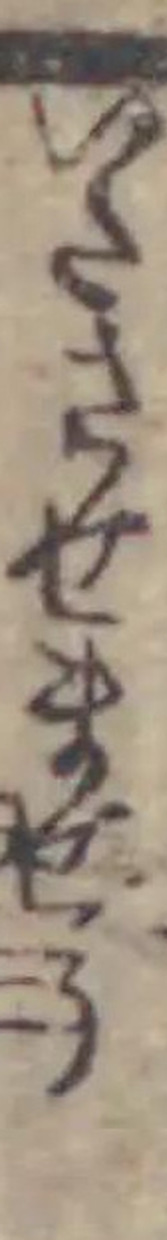いたさせませう
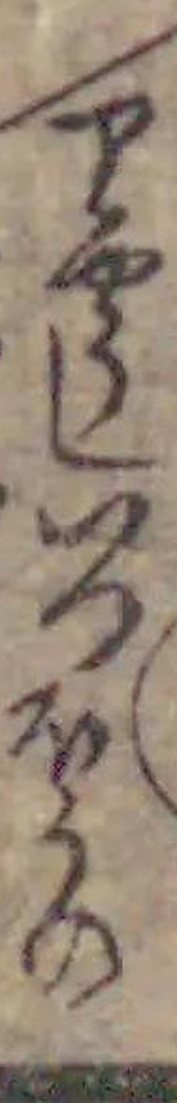りやうしいつほうの
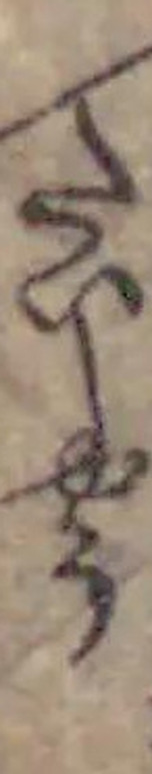たいしやう
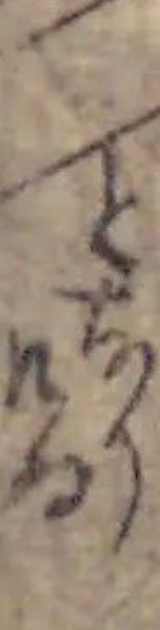となり
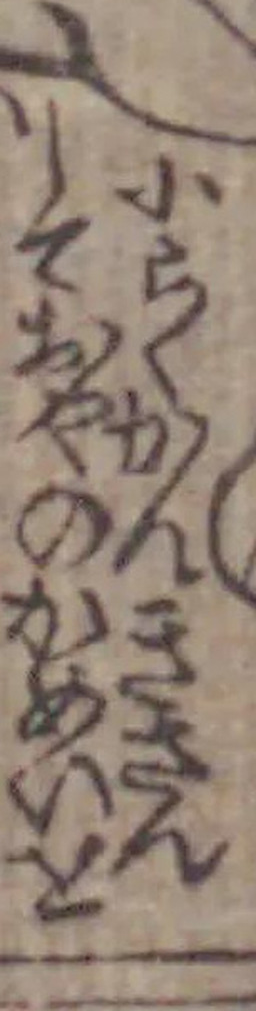しておやのかめいを
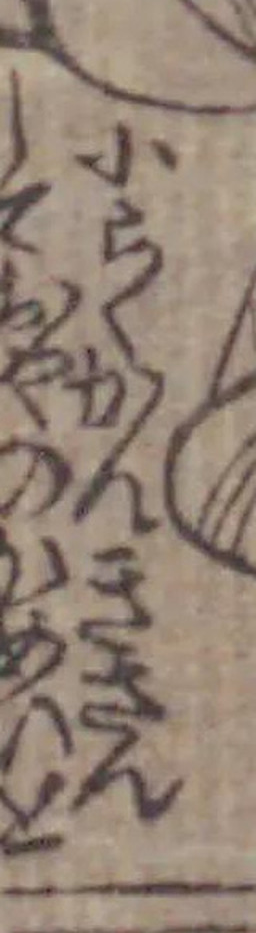小らくがんきさん
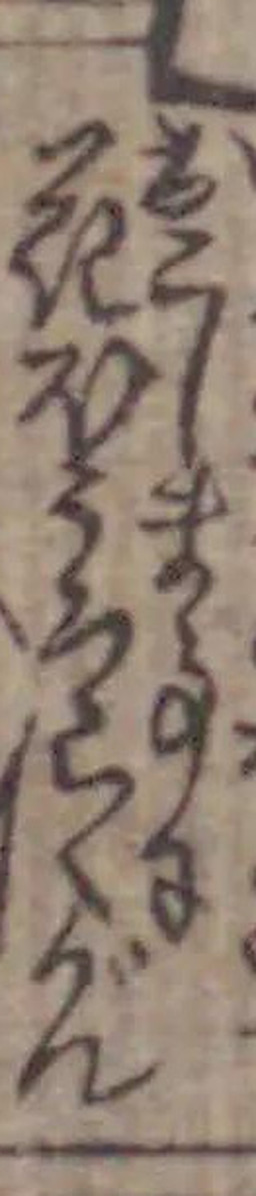花ほうろらくがん
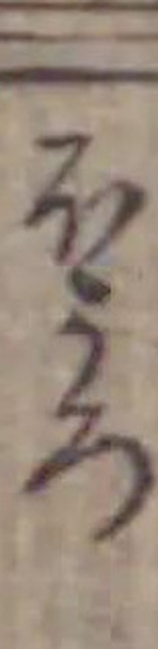ほうろ
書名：名代干菓子山殿 3巻
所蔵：国立国会図書館 National Diet Library, JAPAN
